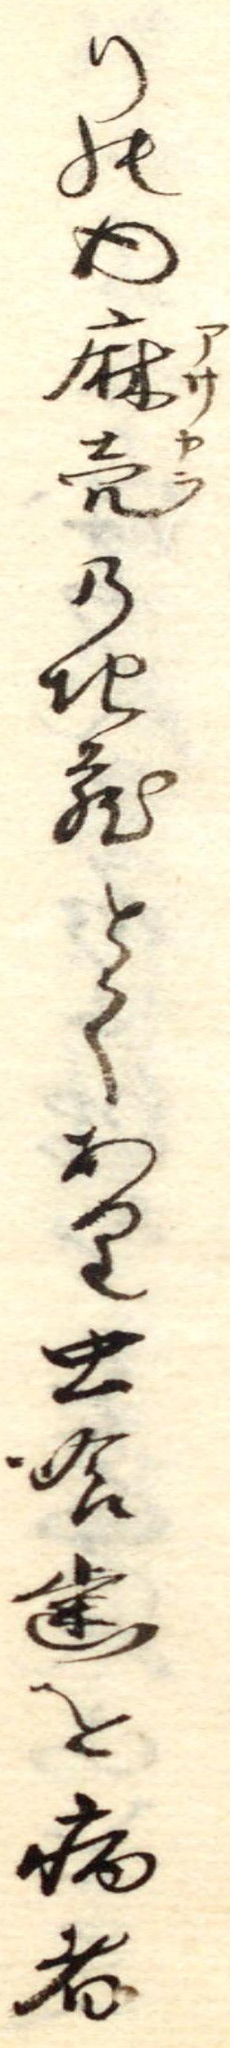りの内麻殼の地蔵とてあり虫喰歯を病者
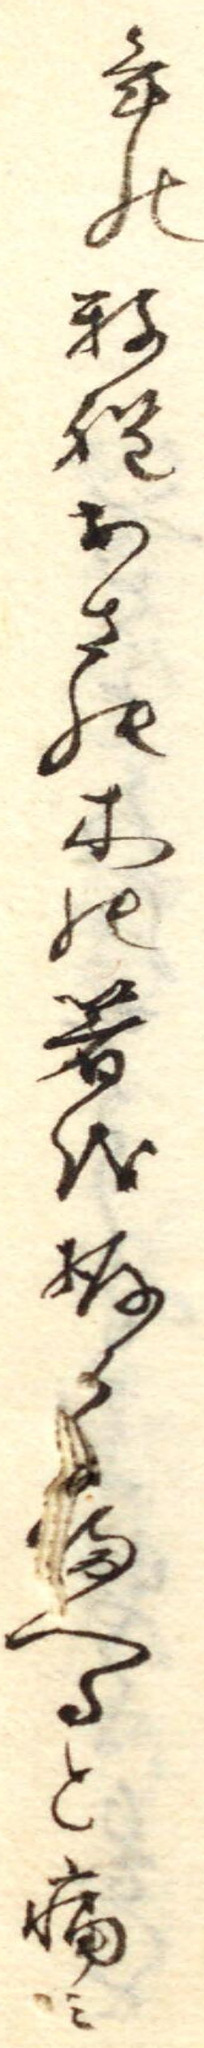年の数程あさの木の箸を渡て帰へると痛み
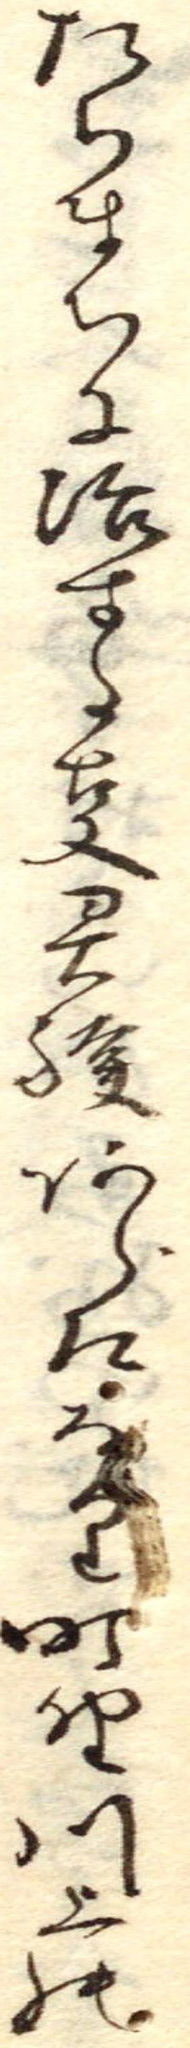たちまちに治する事霊験あらたなり町野川上の
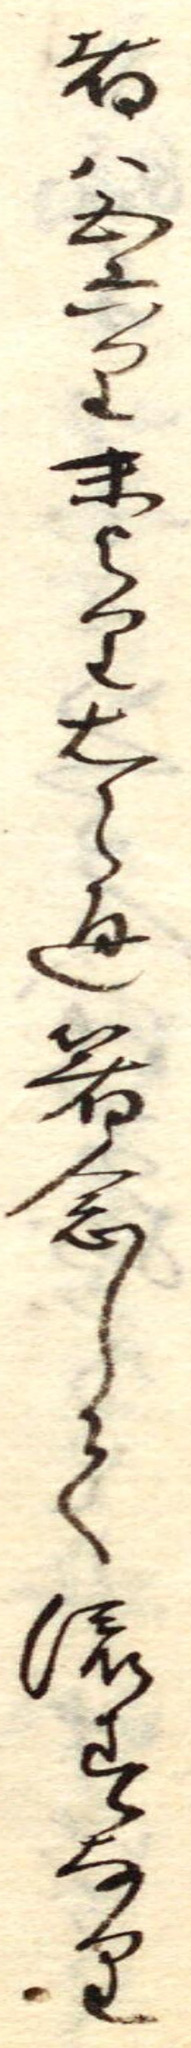者は五六里末より右之通箸念して流すなり
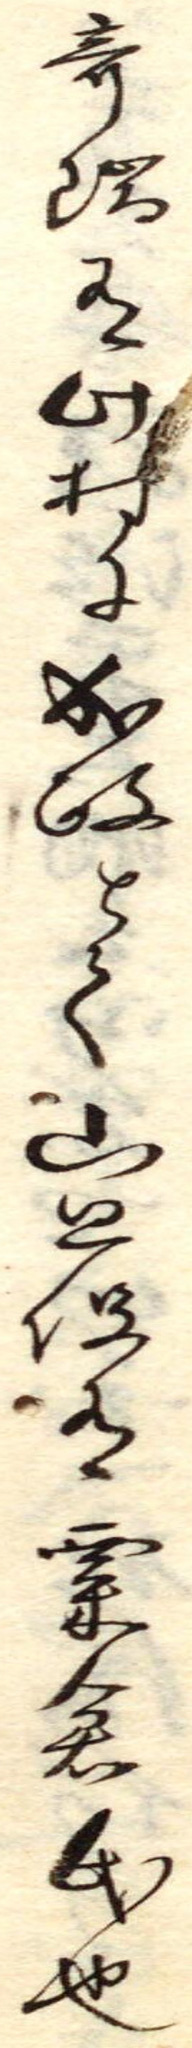奇瑞有此村に成政とて山廻役有粟倉氏也
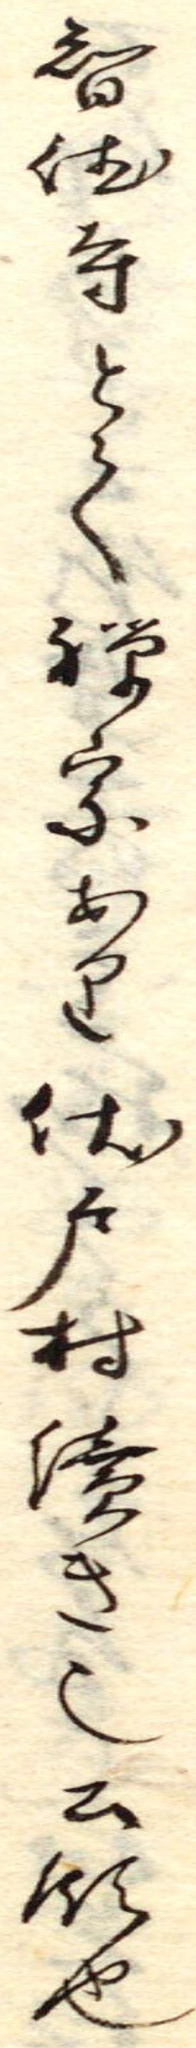智徳寺禅宗あり伏戸村続き也公領也
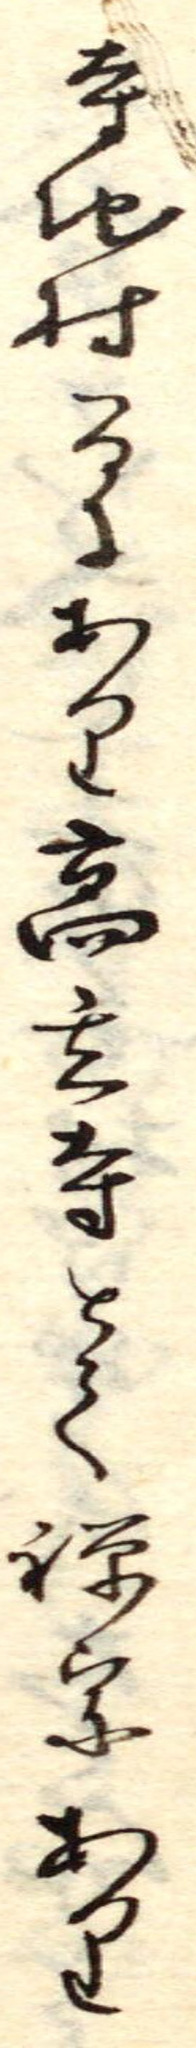寺地村間にあり高玄寺とて禅宗あり
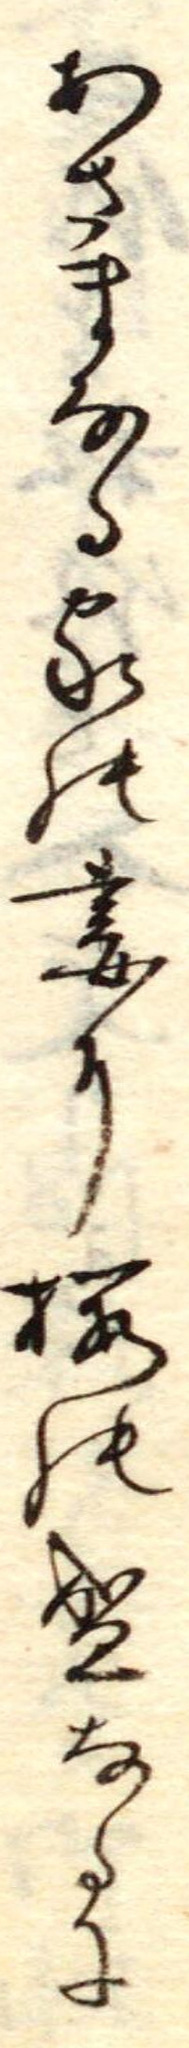あさまなる家の妻に桜の盛なるに
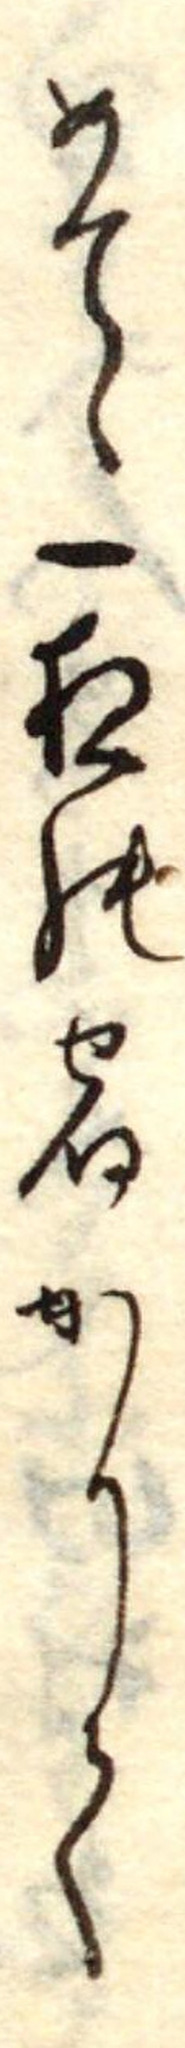めてゝ一夜の宿かりて
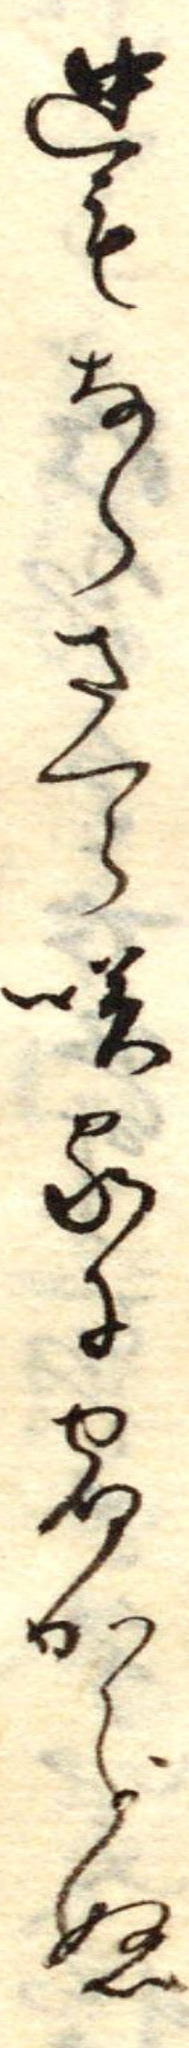迚もならさくら咲家に宿かしぬ

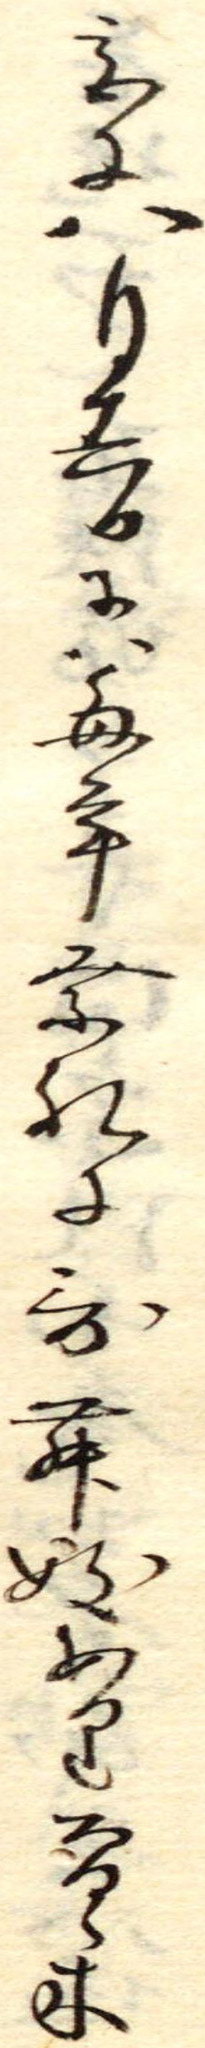宮に八月十六日には毎年祭礼に哥舞歌舞伎ある曽々木
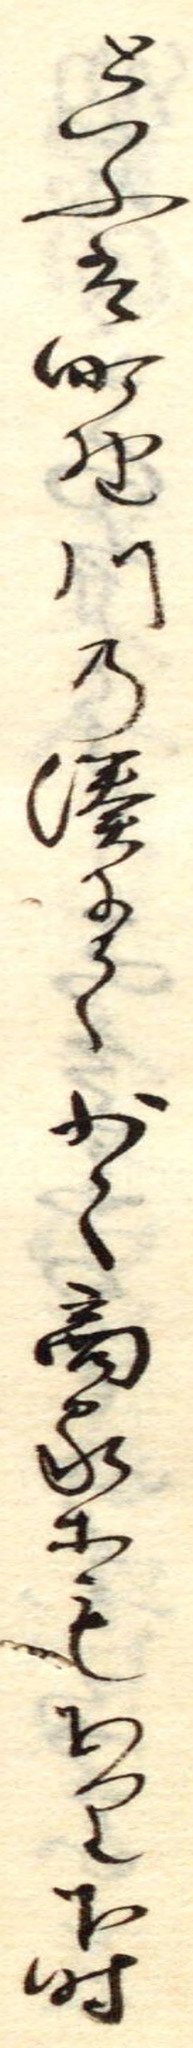といふは町野川の湊にて少々商家等もあり下時
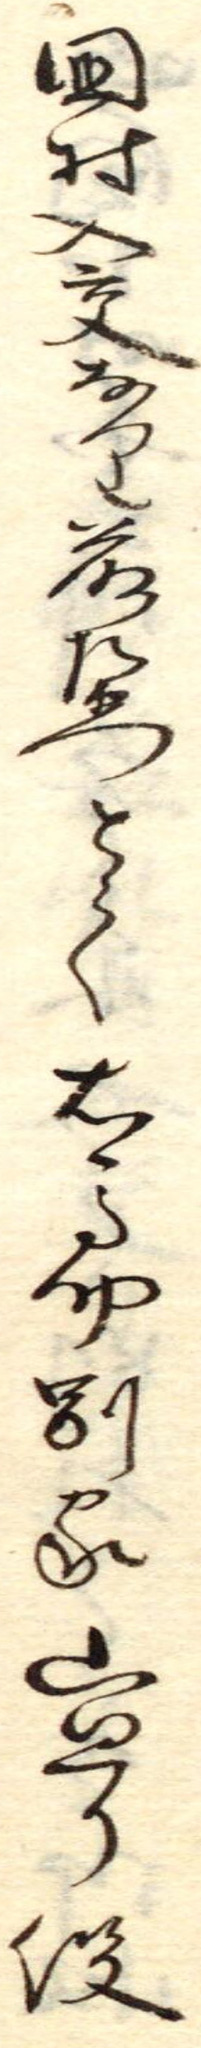国村入交なり藤左衛門とて右馬助別家山廻り役
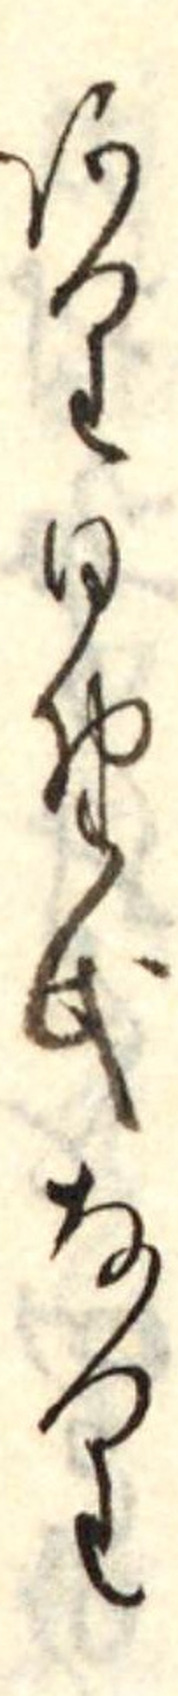あり日野氏なり
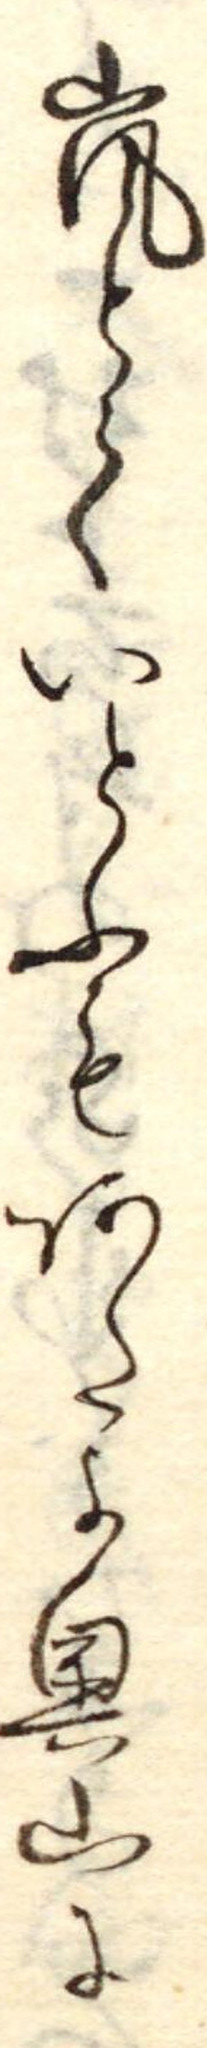嵐とていとふもあたに奥山に
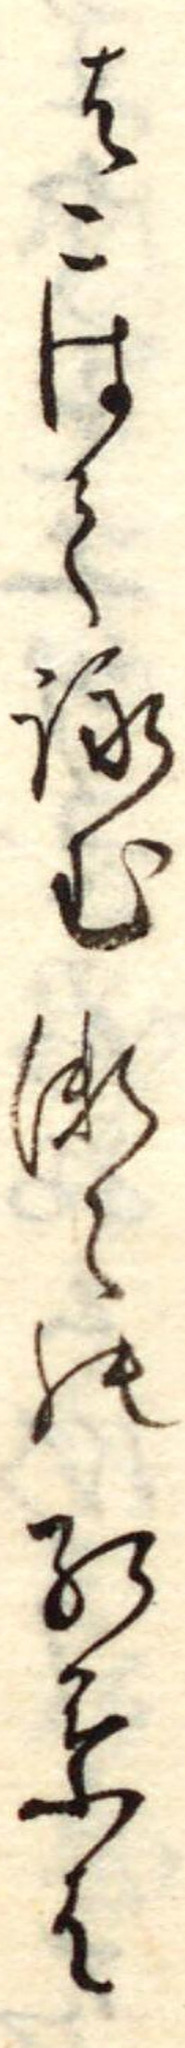はこはて詠む瀬々の紅葉は
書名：能登名跡誌
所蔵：Ishikawa Prefectural Library
